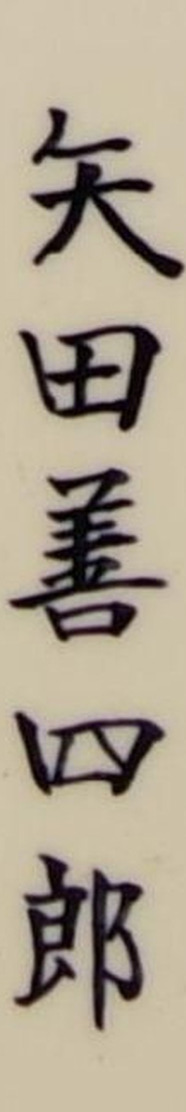矢田善四郎
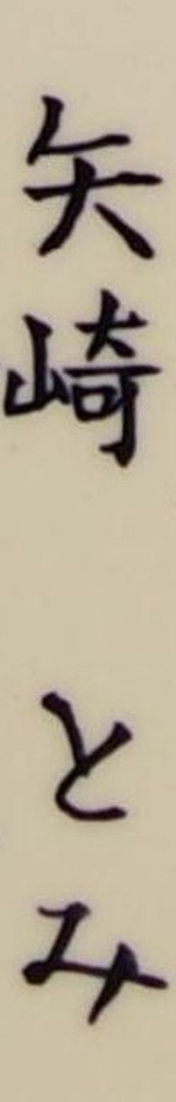矢崎とみ
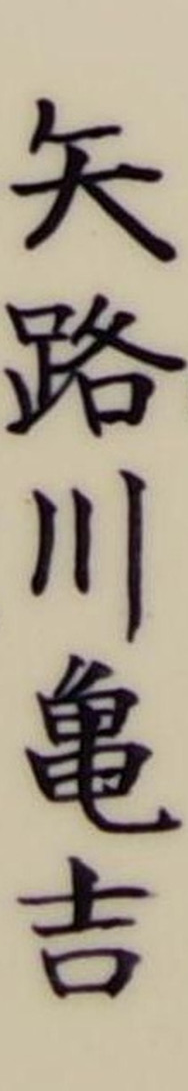矢路川亀吉
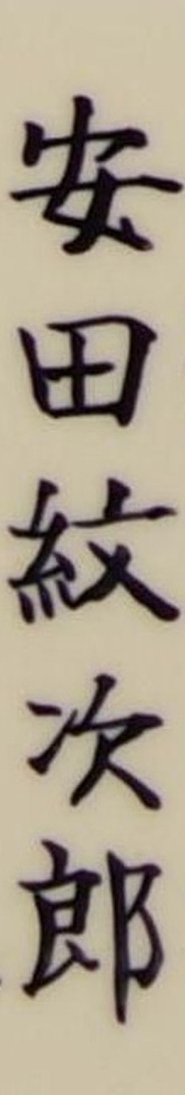安田紋次郎
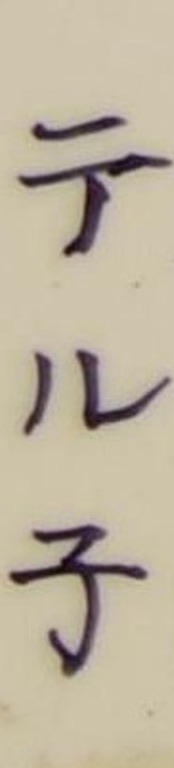テル子

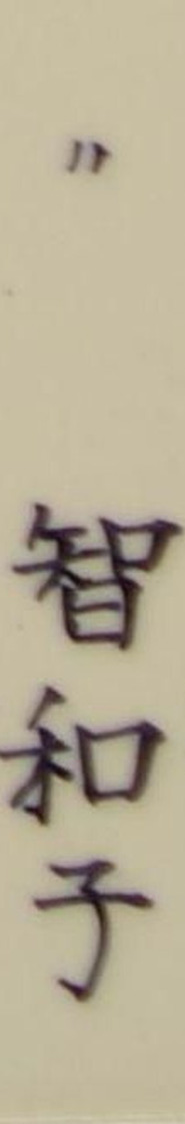智和子
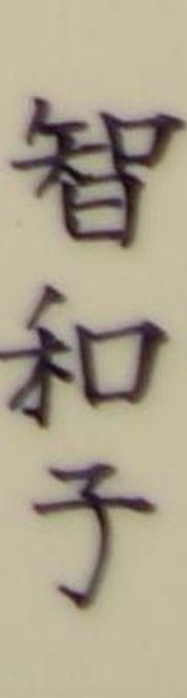智和子
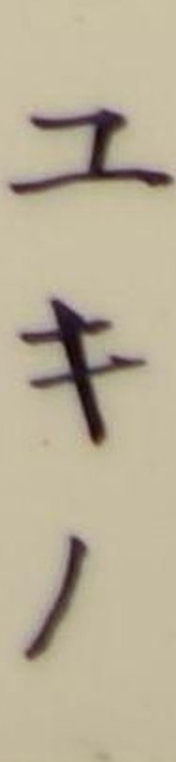ユキノ
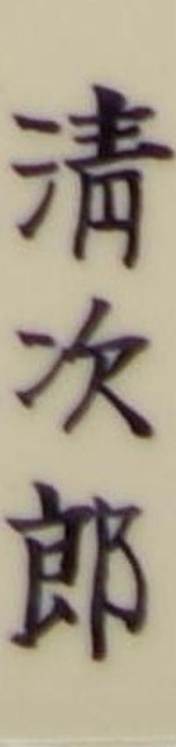清次郎
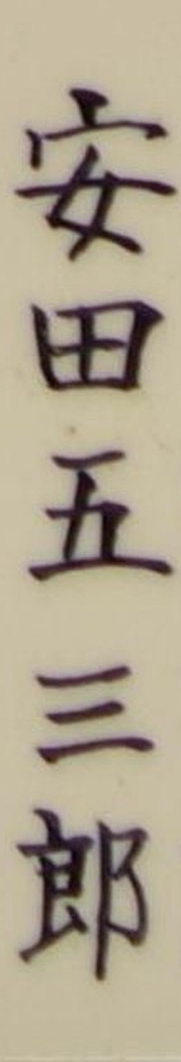安田五三郎
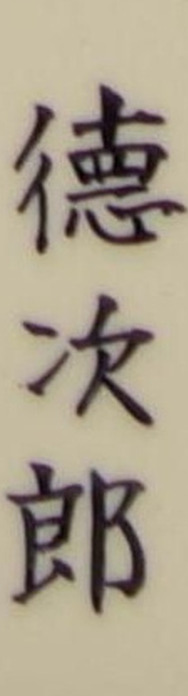徳次郎
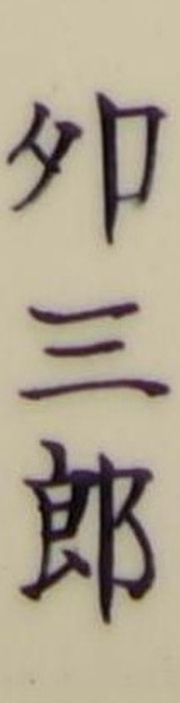卯三郎
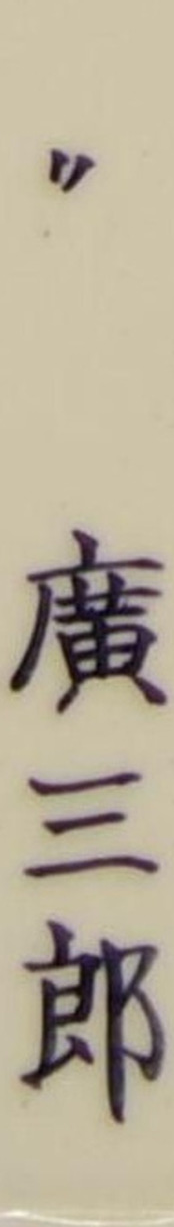卯三郎
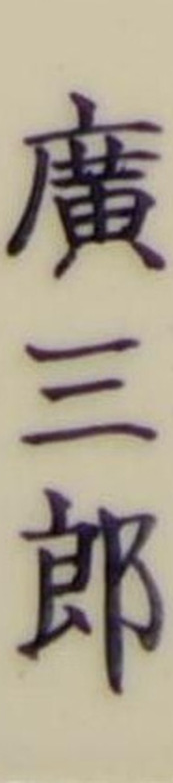卯三郎
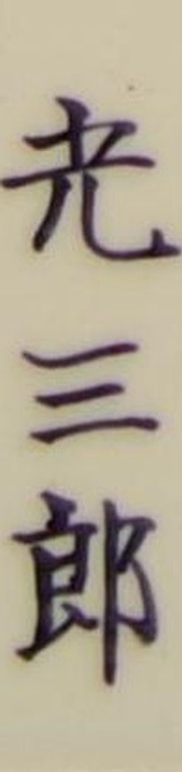光三郎
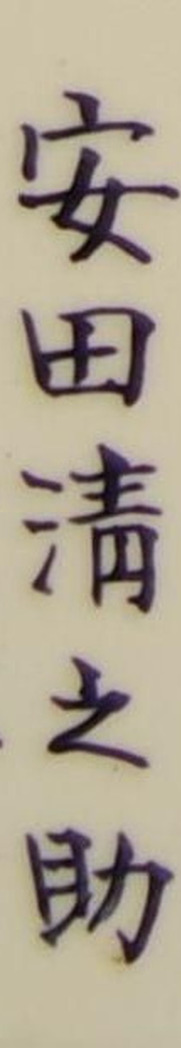安田清之助
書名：A~D
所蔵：koyasan kongobuji
